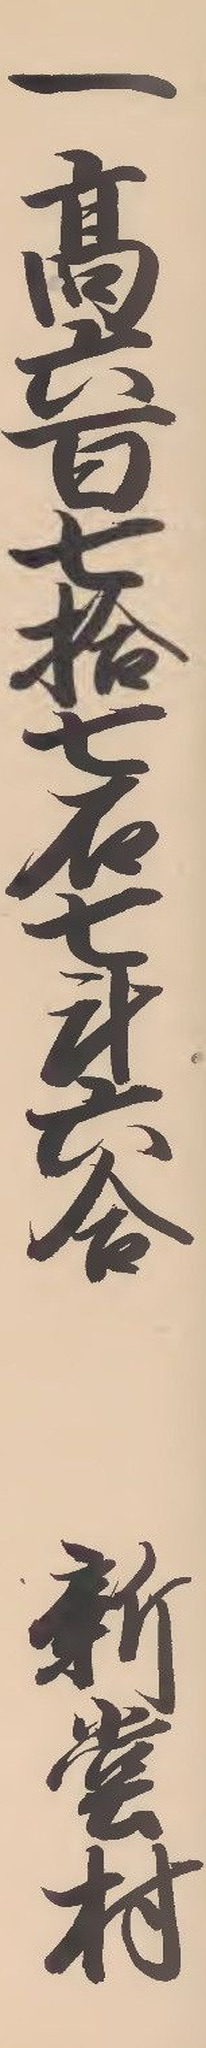一高六百七拾七石七斗六合新堂村
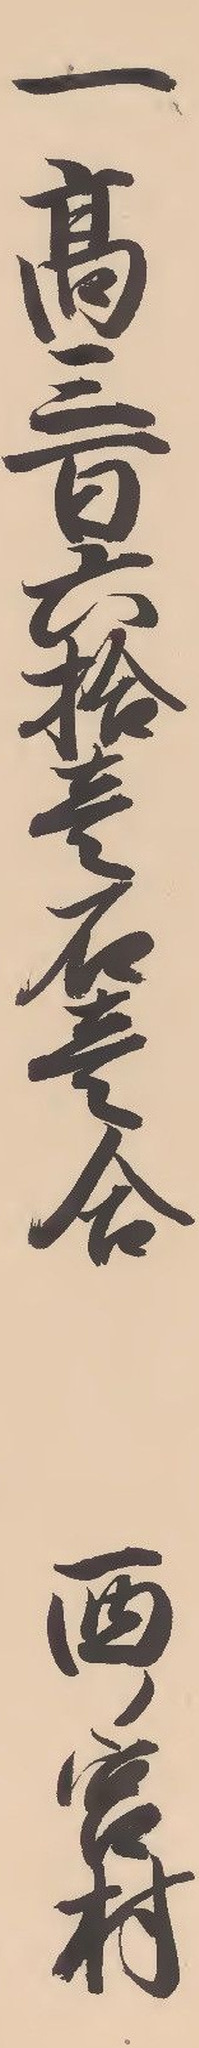一高三百六拾壱石壱合西ノ宮村
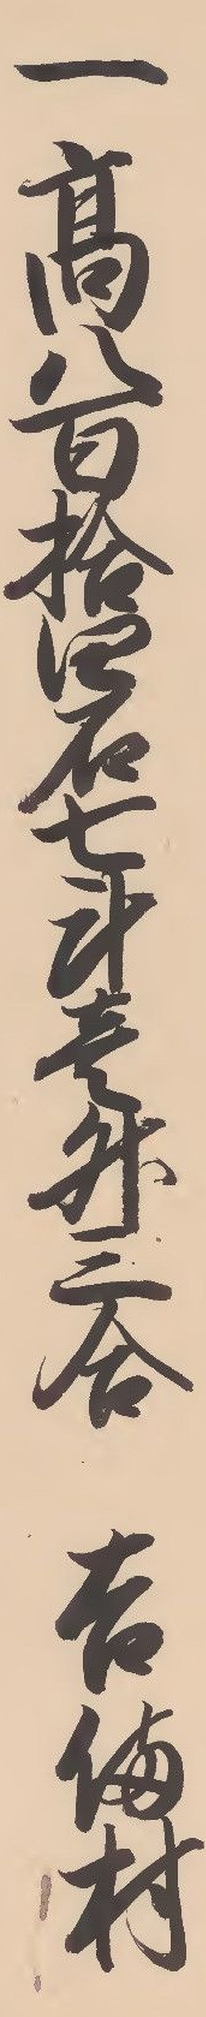一高八百拾四石七斗壱升三合吉備村

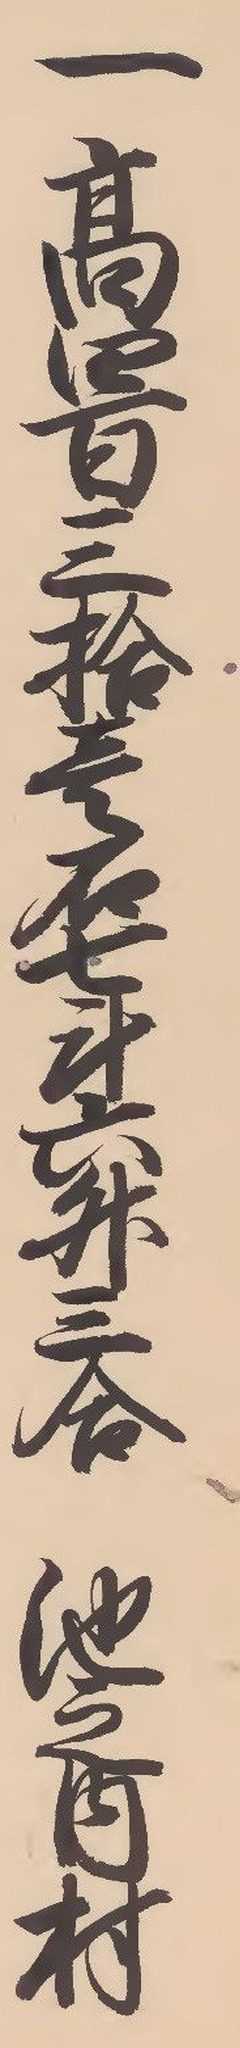一高四百三拾壱石七斗六升三合池之内村
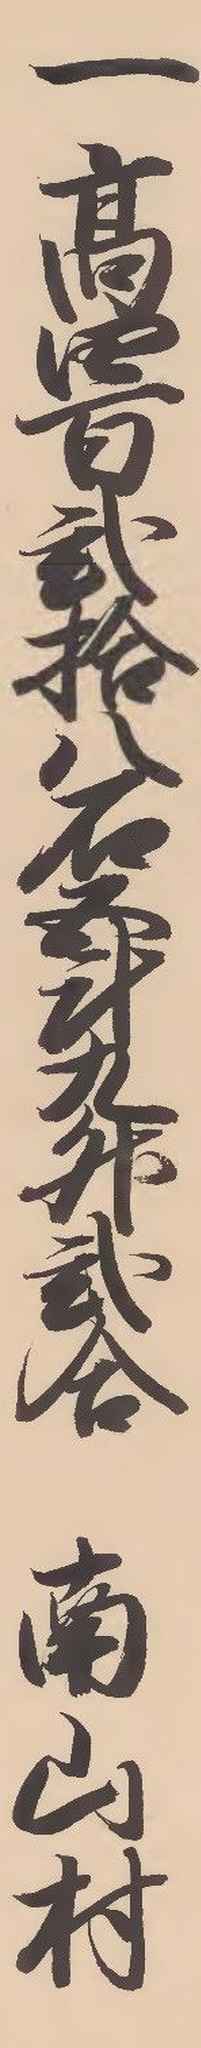一高四百弐拾八石五斗九升弐合南山村
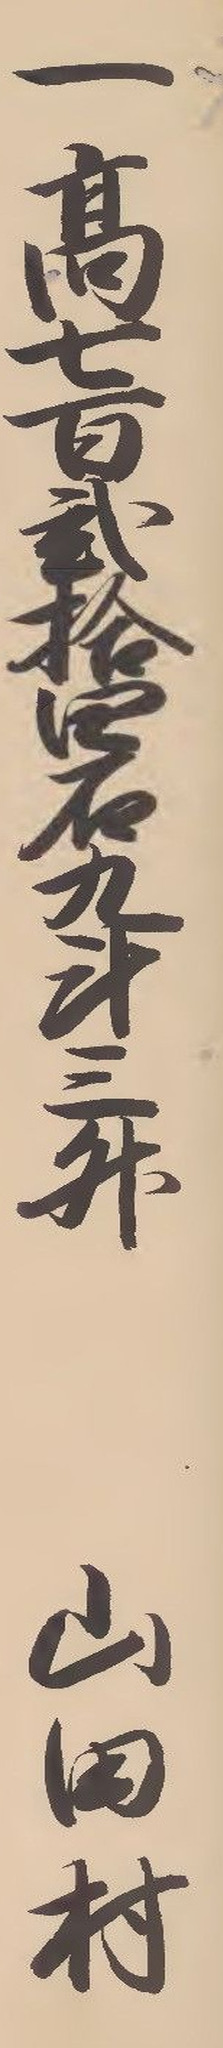一高七百弐拾四石九斗三升山田村
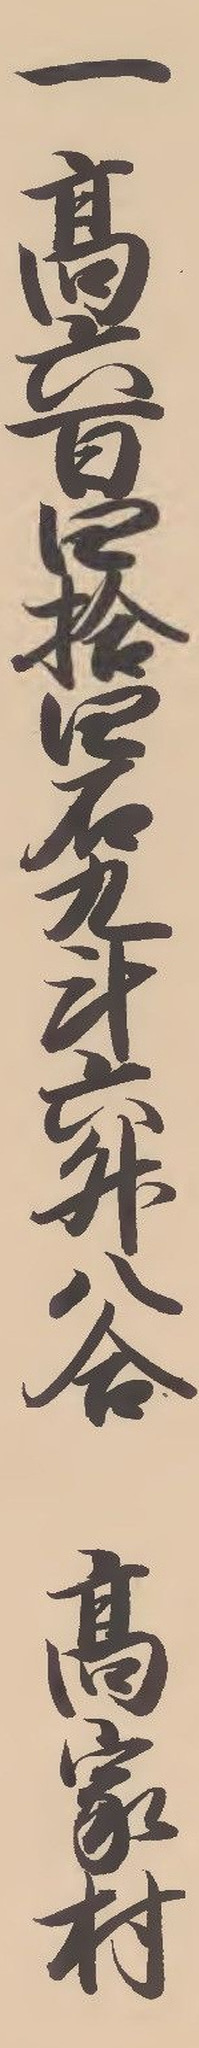一高六百四拾四石九斗六升八合高家村
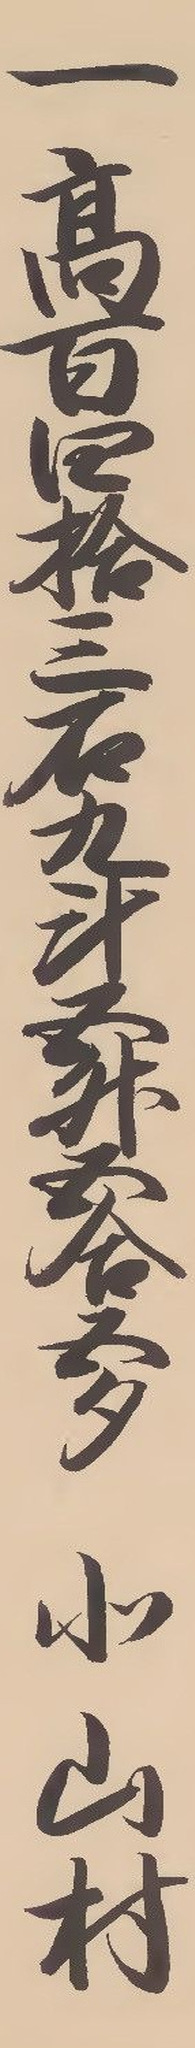一高百四拾三石九斗五升五合五勺北山村
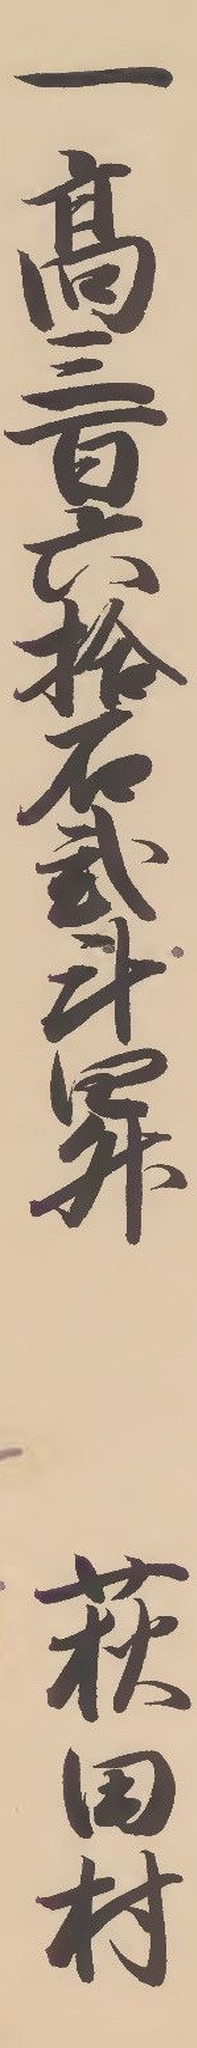一高三百六拾石弐斗四升萩田村

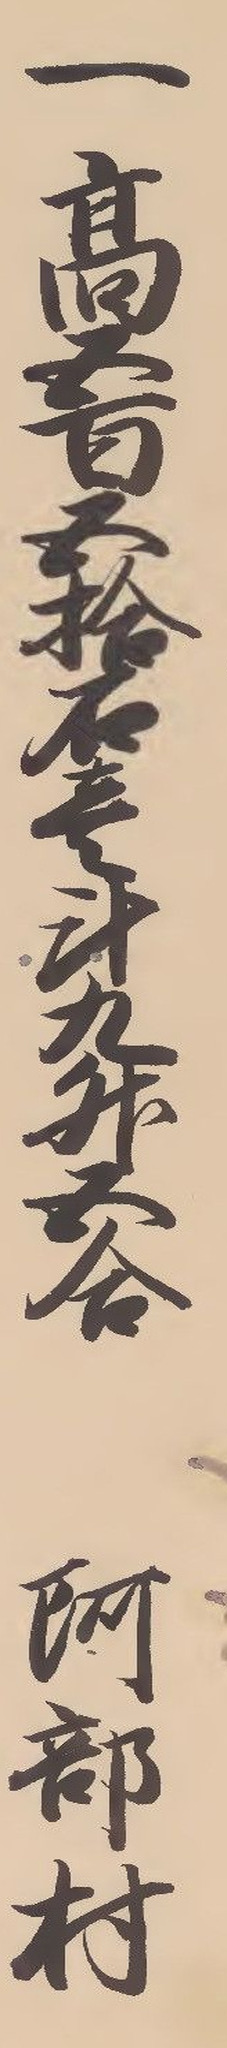一高五百五拾石壱斗九升五合阿部村
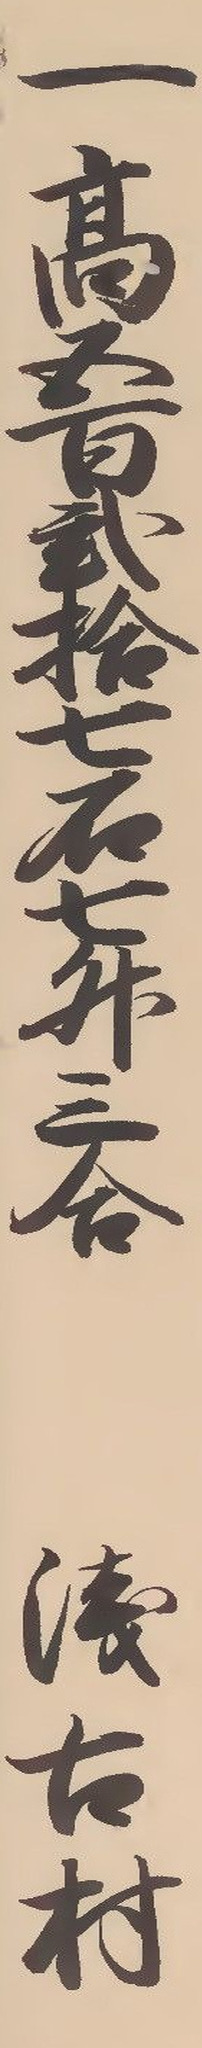一高五百弐拾七石七升三合浅古村
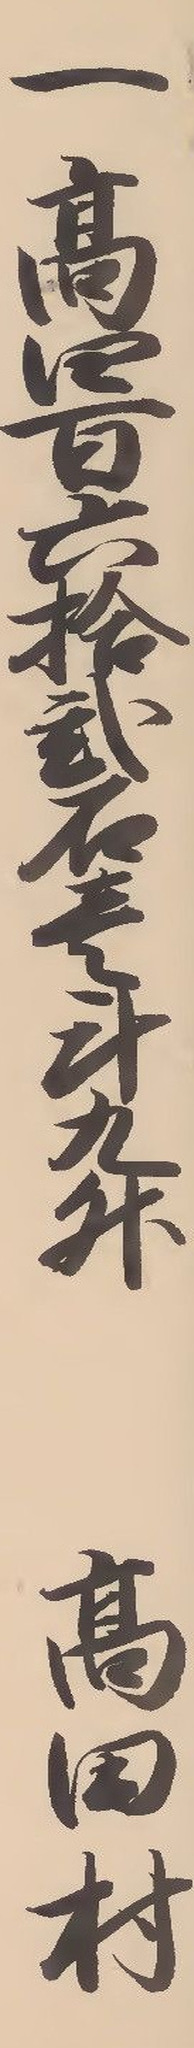一高四百六拾弐石壱斗九升高田村
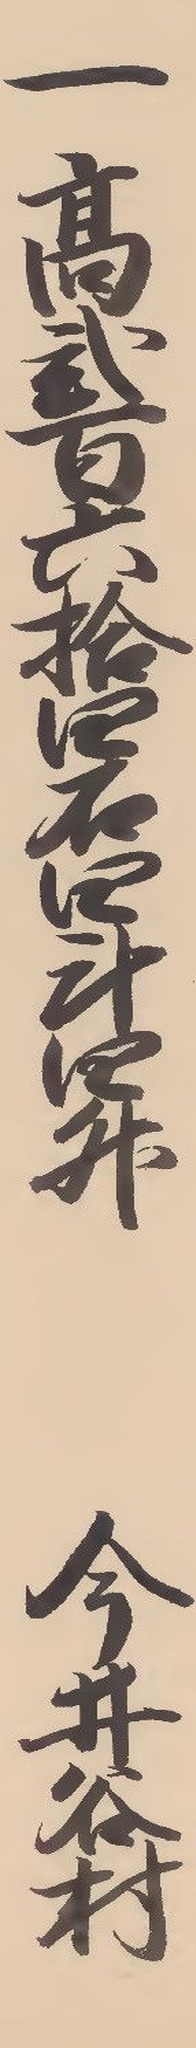一高弐百六拾四石四斗四升今井谷村
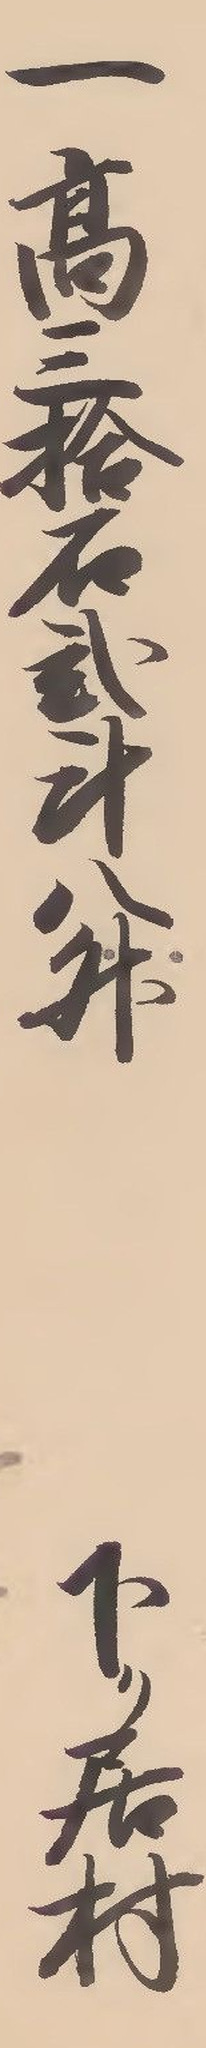一高三拾石弐斗八升下り居村

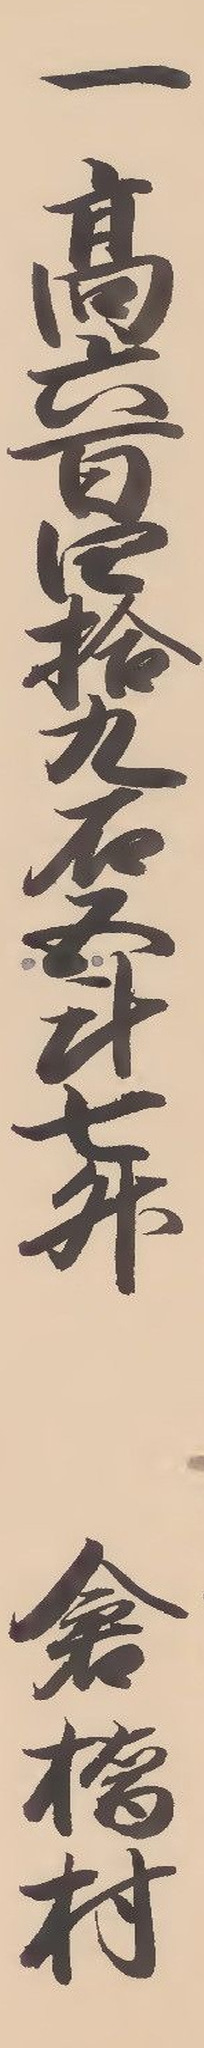一高六百四拾九石五斗七升倉橋村
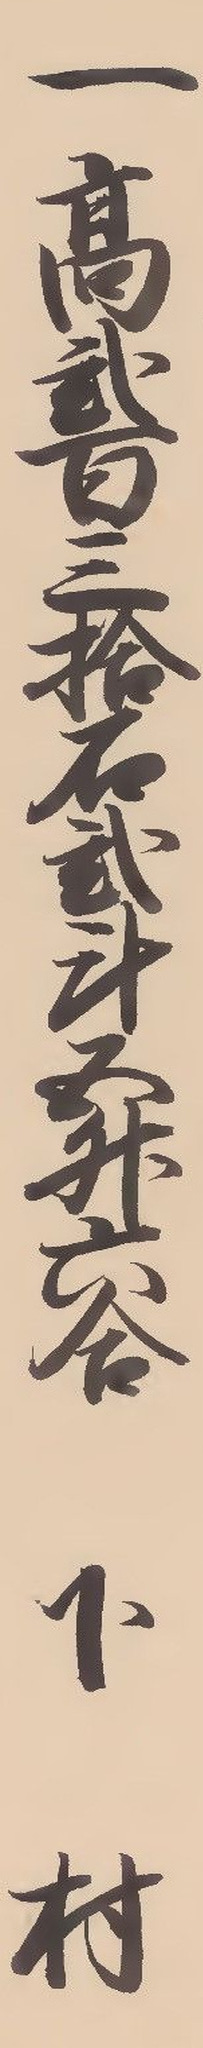一高弐百三拾石弐斗五升六合下村
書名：大和国郷帳
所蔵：国立公文書館 National Archives of Japan
